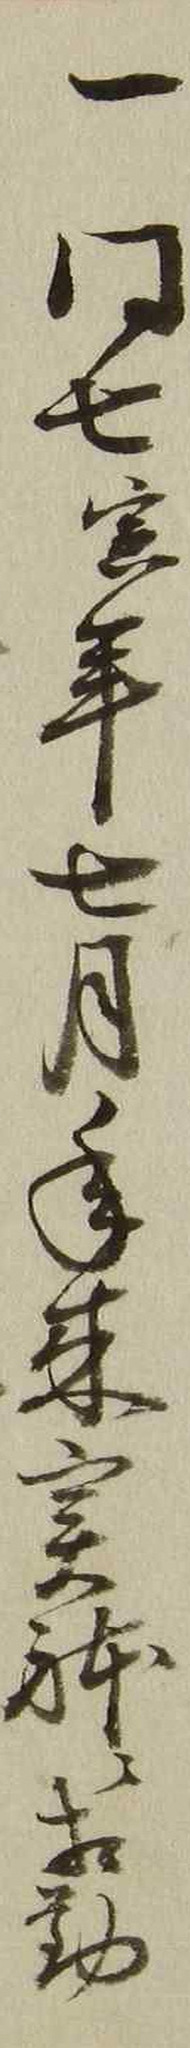一同七寅年七月年来実体ニ相勤
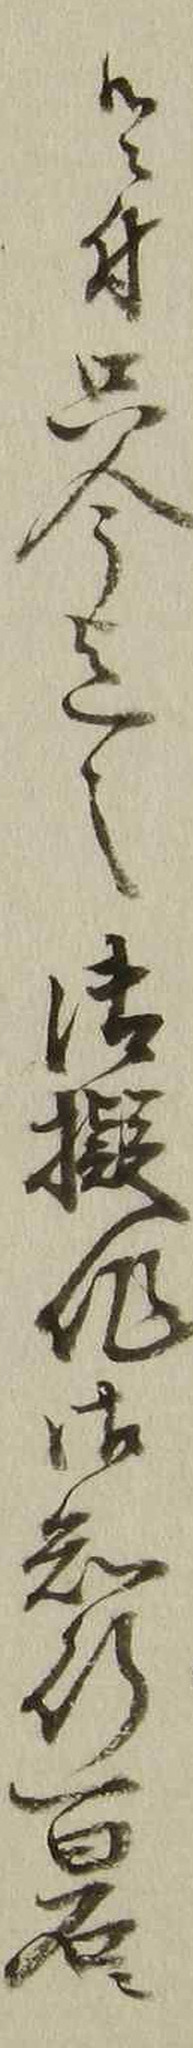候ニ付只今迄之御擬作御知行百石ニ
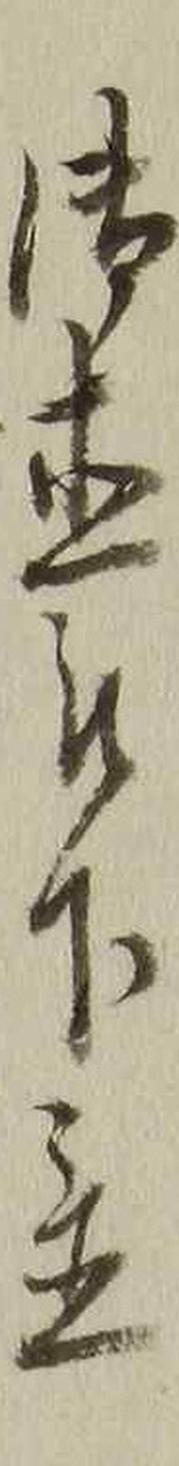御直被下置
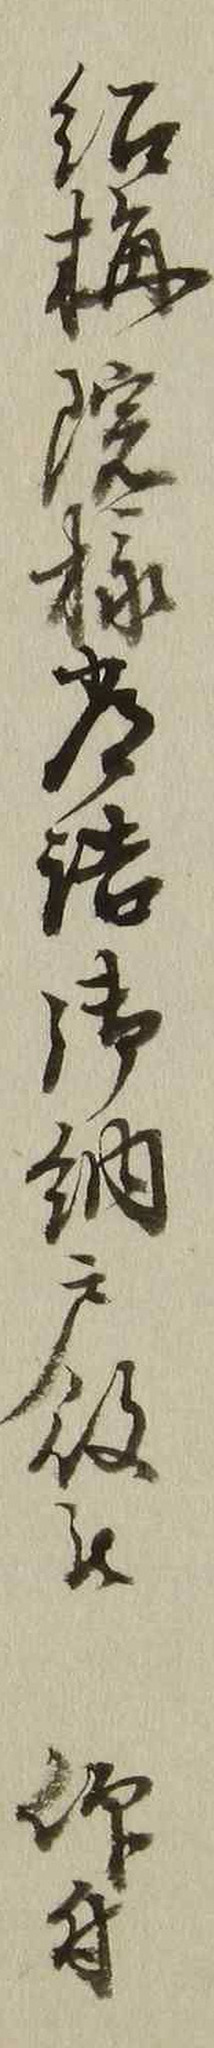紹栴院様常詰御納戸役被仰付
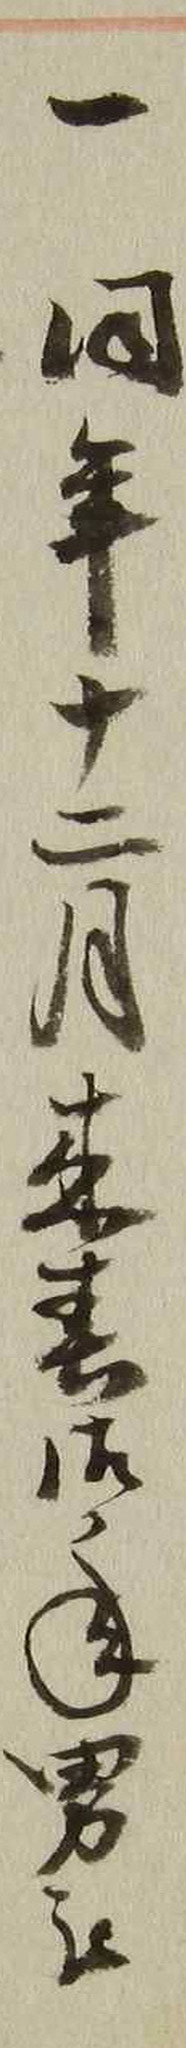一同年十二月来春御年男被
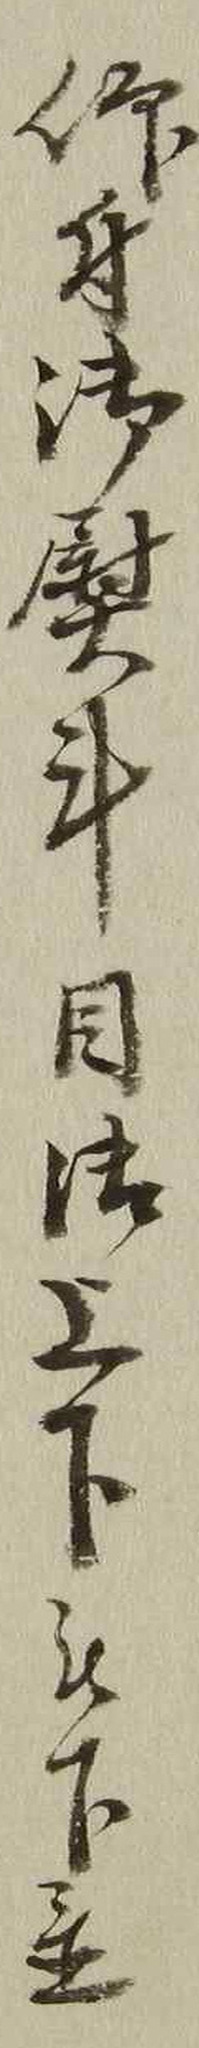仰付御熨斗目御上下被下置
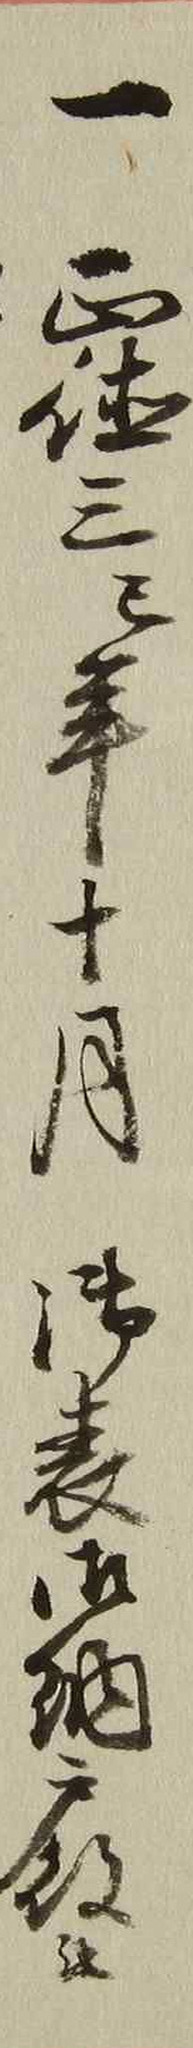一正徳三巳年十月御表御納戸役被
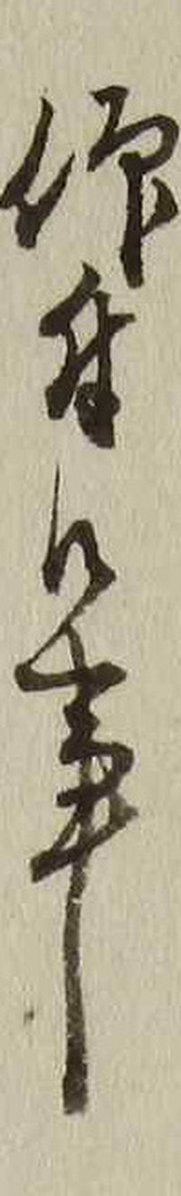仰付候事
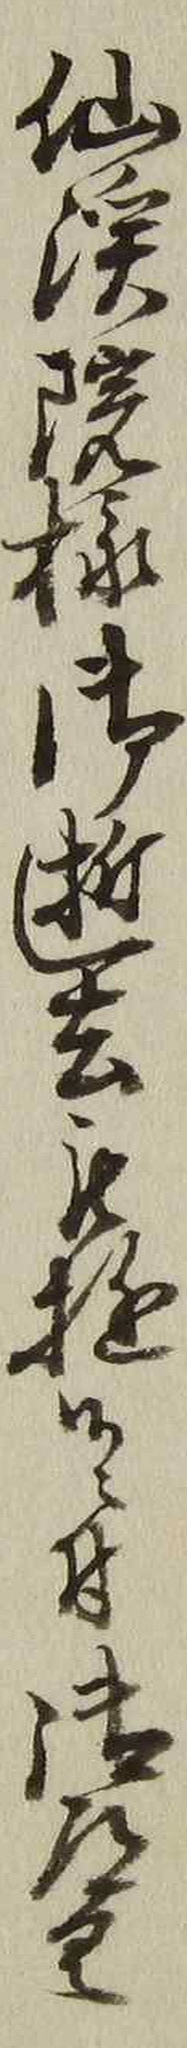仙渓院様御逝去被遊候ニ付御道具
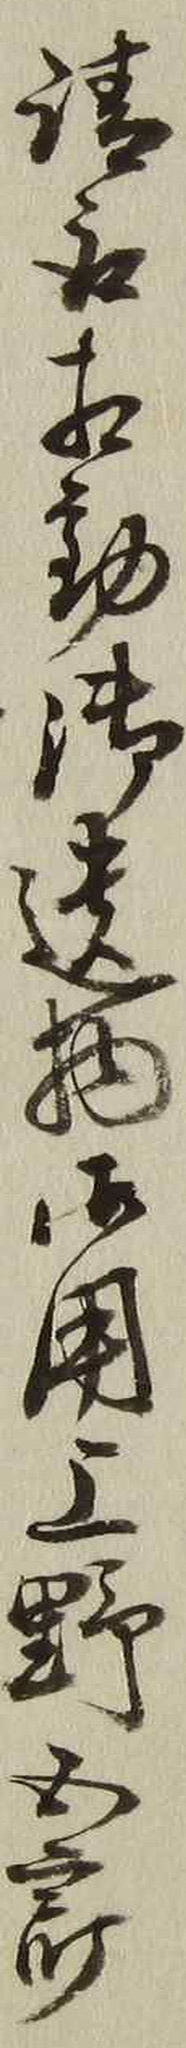請取相勤御遺物御用上野五郎
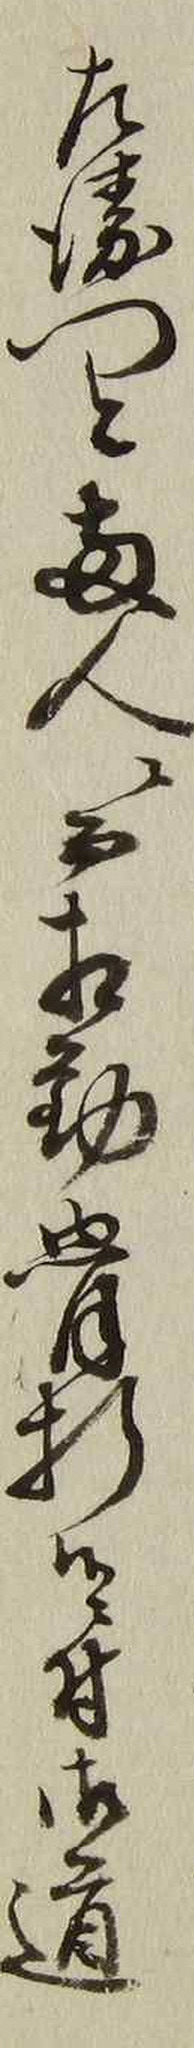左衛門と両人ニ而相勤骨折候ニ付御道
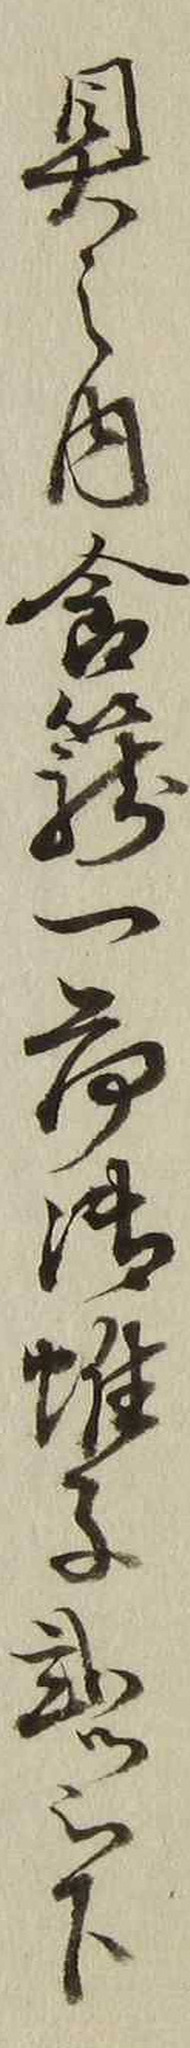具之内食籠一荷御帷子弐ツ被下
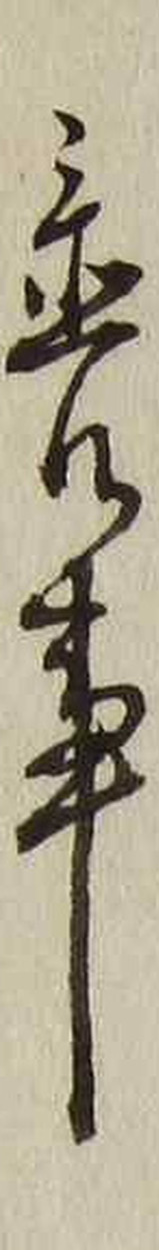置候事
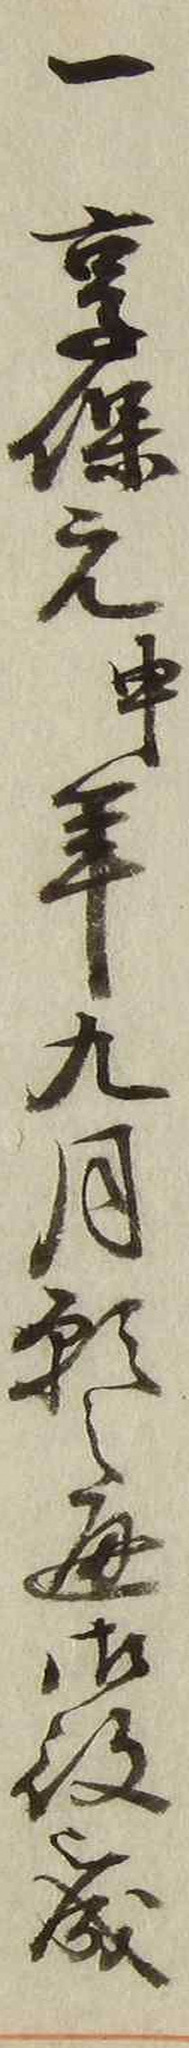一享保元申年九月願之通御役被成

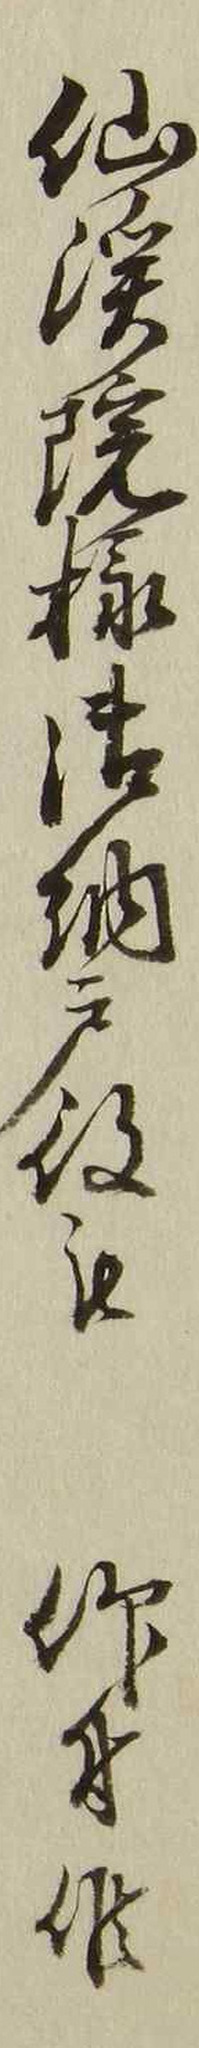仙渓院様御納戸役被仰付候
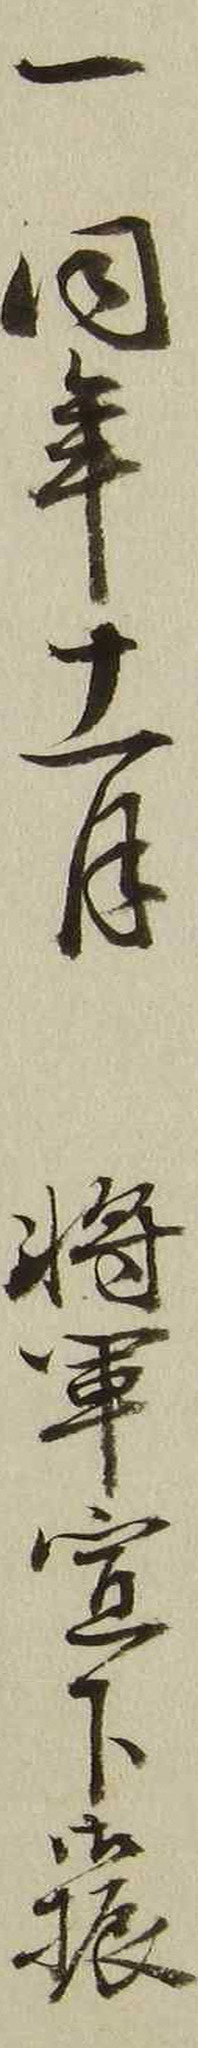一同年十一月将軍宣下御振
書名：諸士系譜　巻之31　い之部31
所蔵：会津若松市立会津図書館
